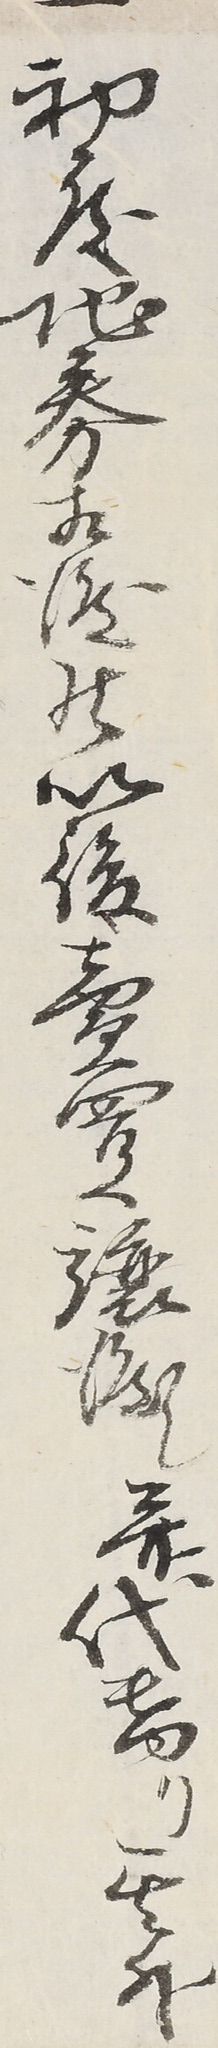一初度地券相渡候以後売買譲渡し并代替り其外
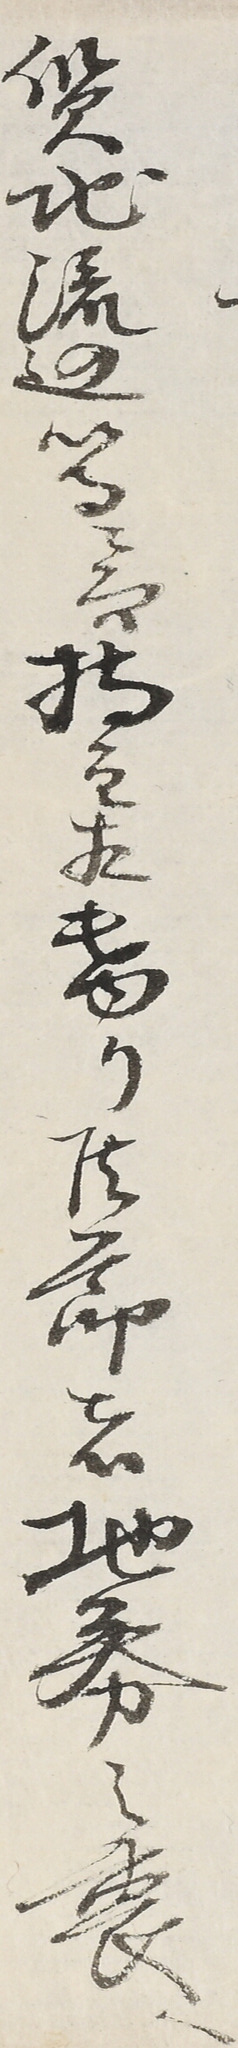質地流込等ニ而持主相替り候節は地券之裏へ
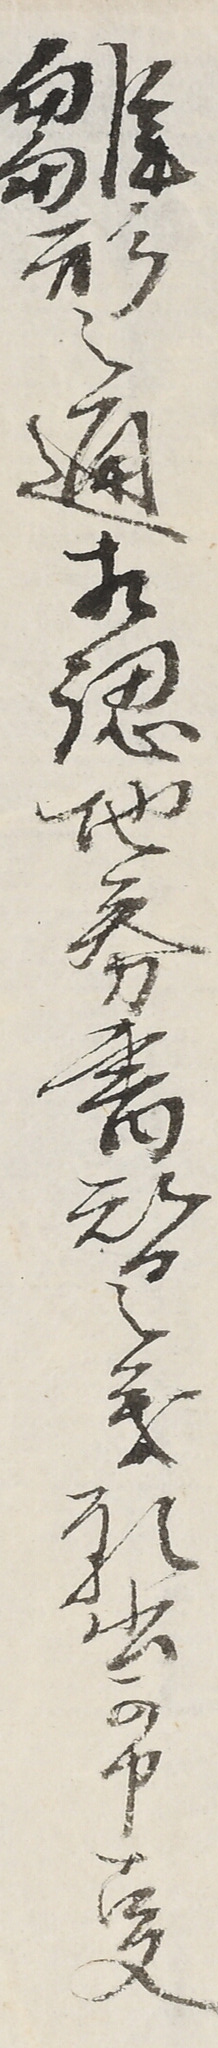雛形之通相認地券書替之義願出可申事
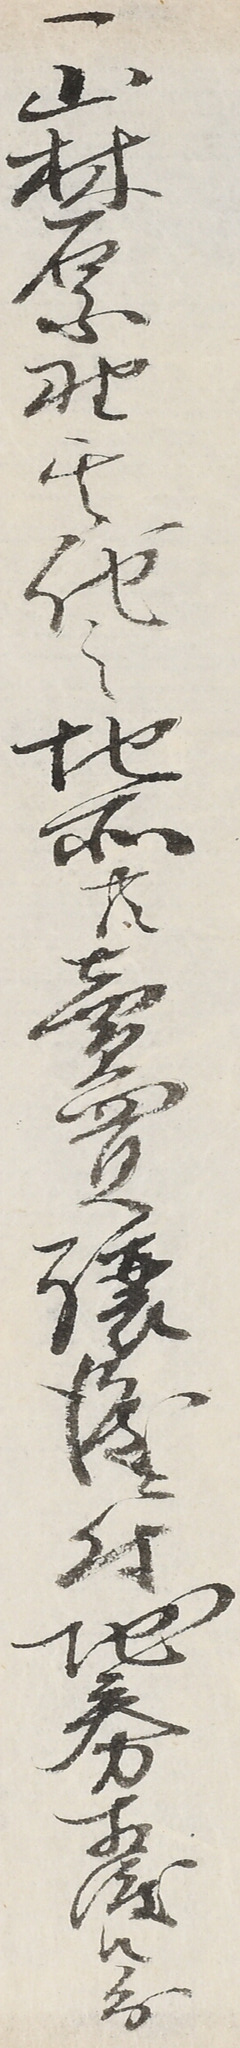一山林原野其地之地所共売買譲渡ニ付地券相渡候分
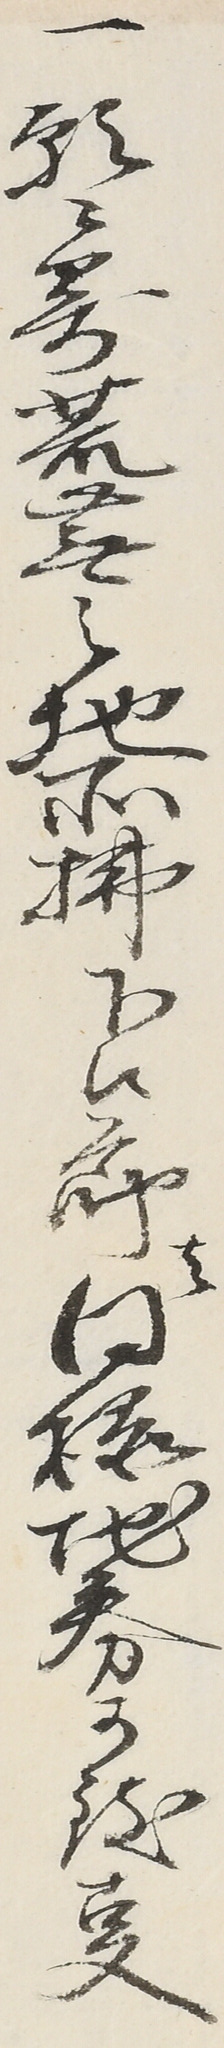一願ニ寄荒蕪之地所払下候節は同様地券可致事
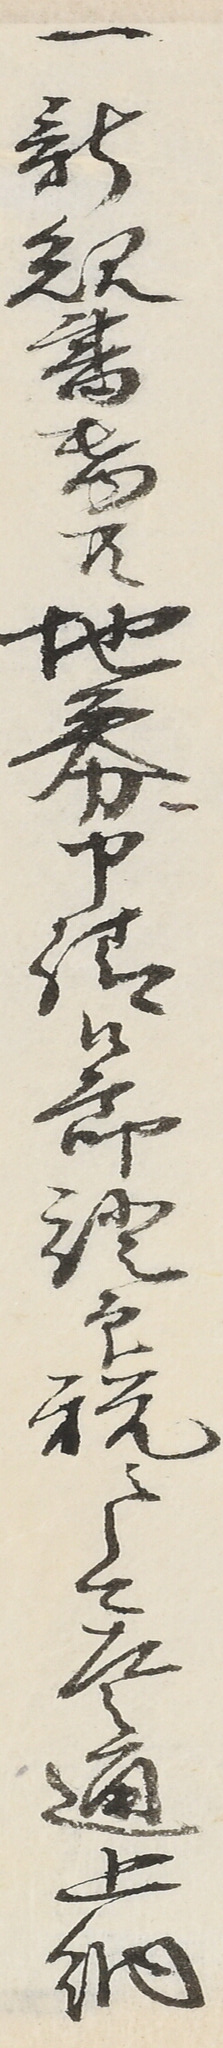一新規書替供共地券申請候節証印税ニして左之通上納
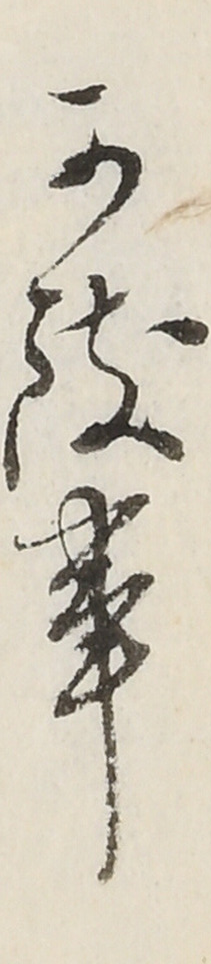可致事
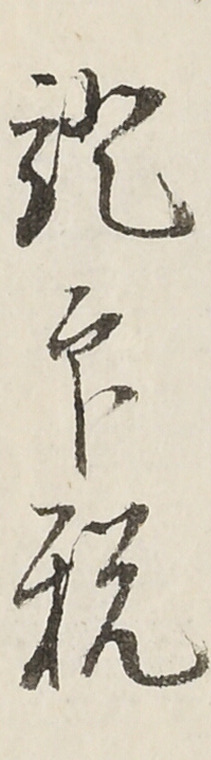証印税
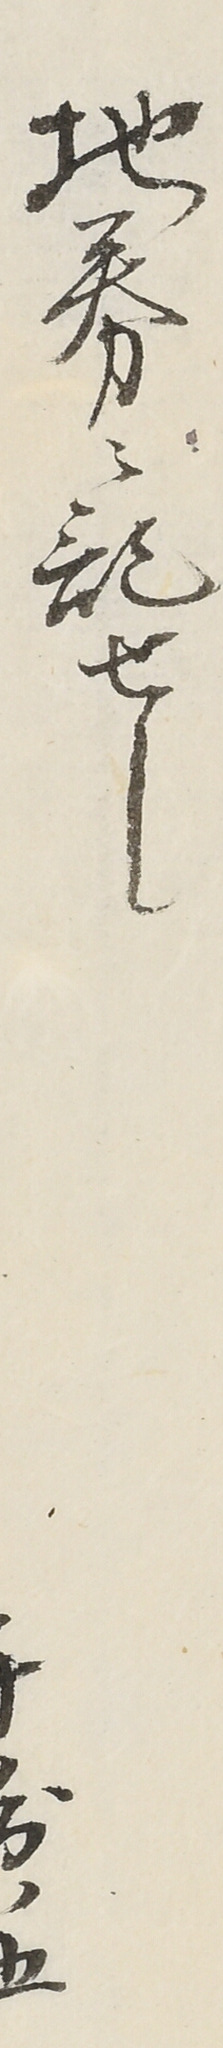地券ニ記せし千歩之五
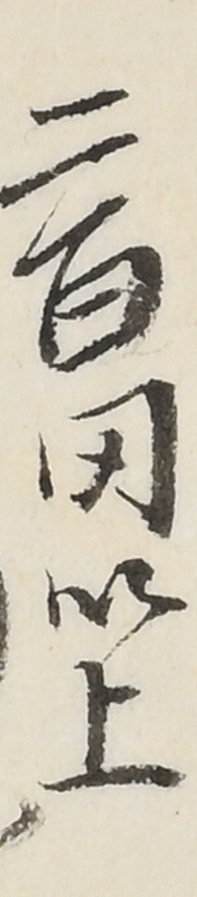同百間以上

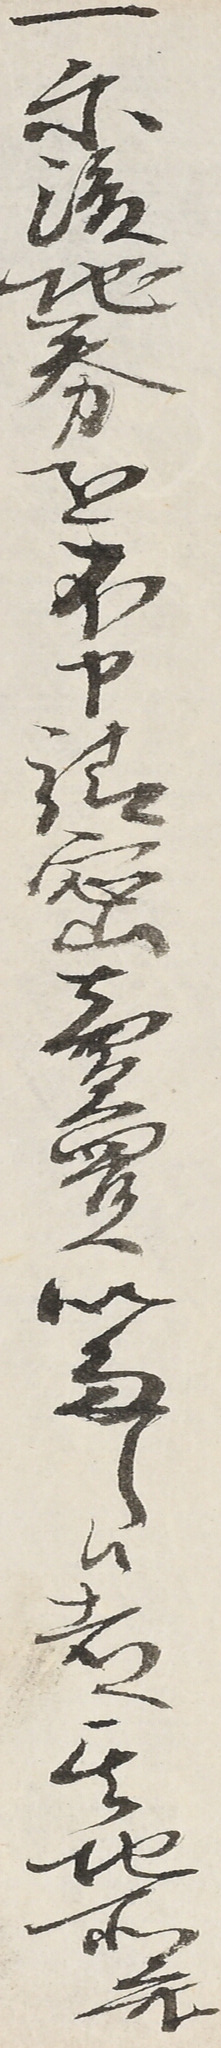一尓後地券を不申請密売買いたし候者へ其地所并
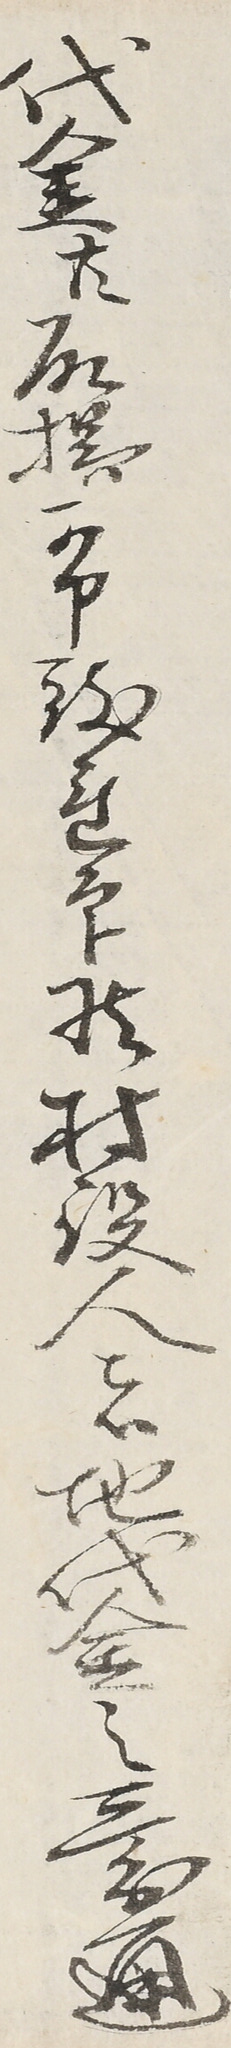代金共取揚可申致連印候村役人は地代金之三分通
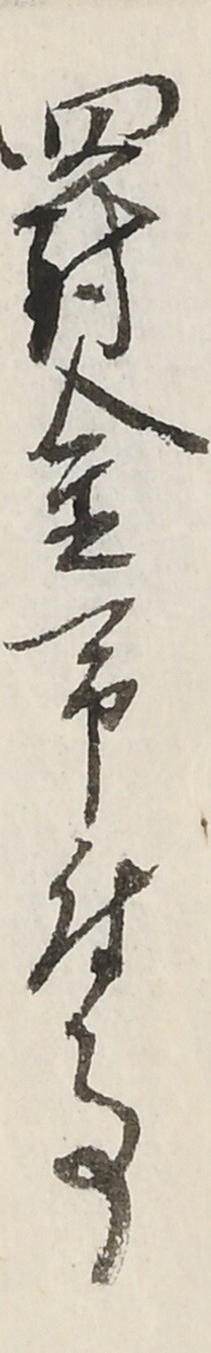罰金可申付事
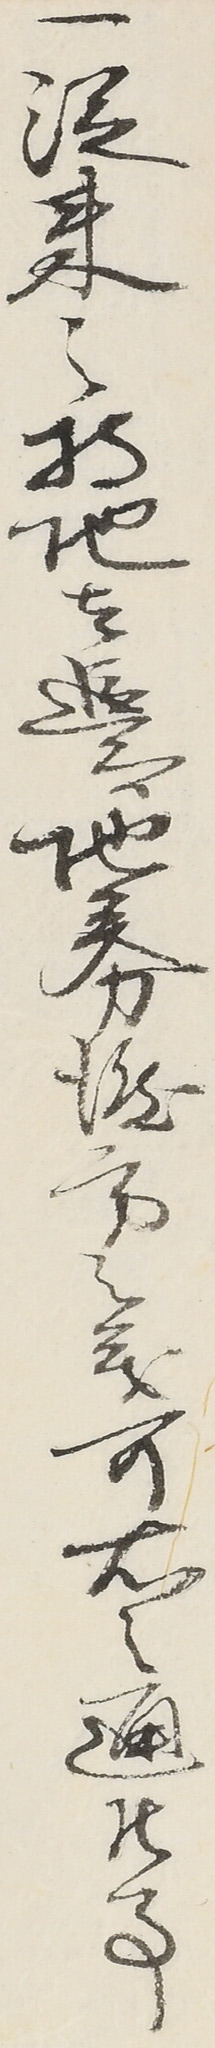一従来之持地を追而地券渡方之義可右之通候事
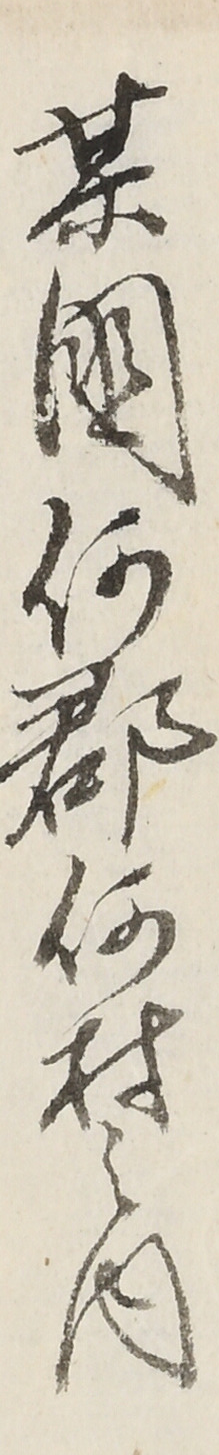某国何郡何村之内
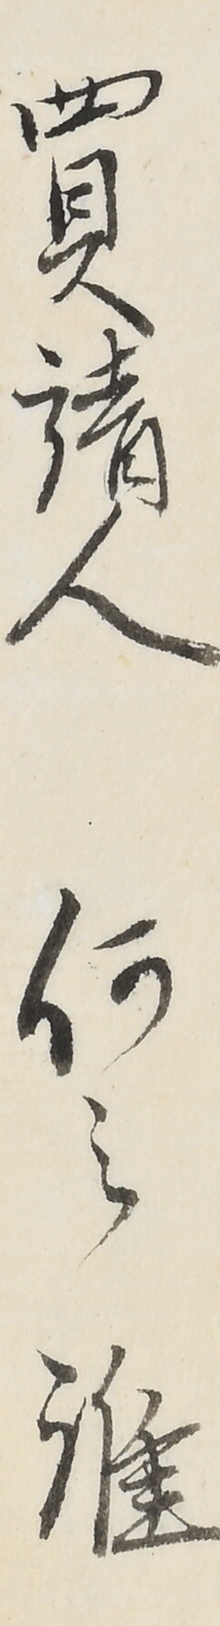買請人何之誰
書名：廻状（控）
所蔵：伊那市立高遠町図書館・合同会社AMANE
